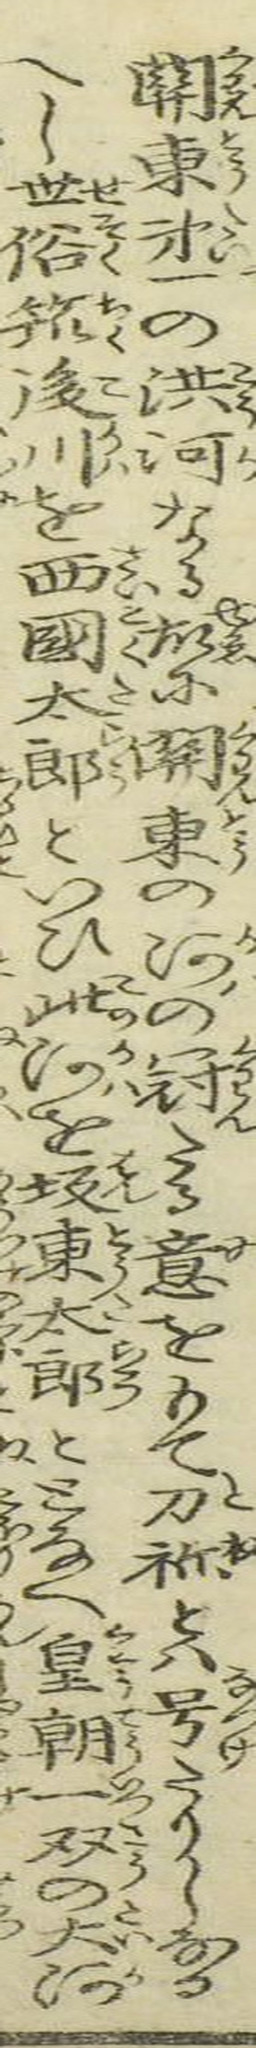へし世俗筑後川を西国太郎といひ此河を坂東太郎ととなへ皇朝一双の大河
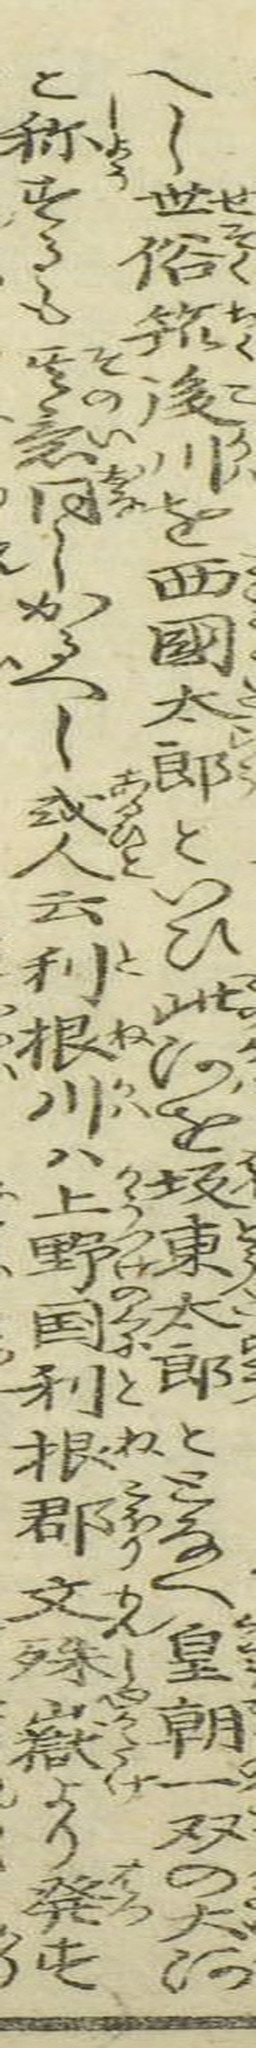を称するも其意同しかるへし或人云利根川は上野国利根郡文珠嶽より発す
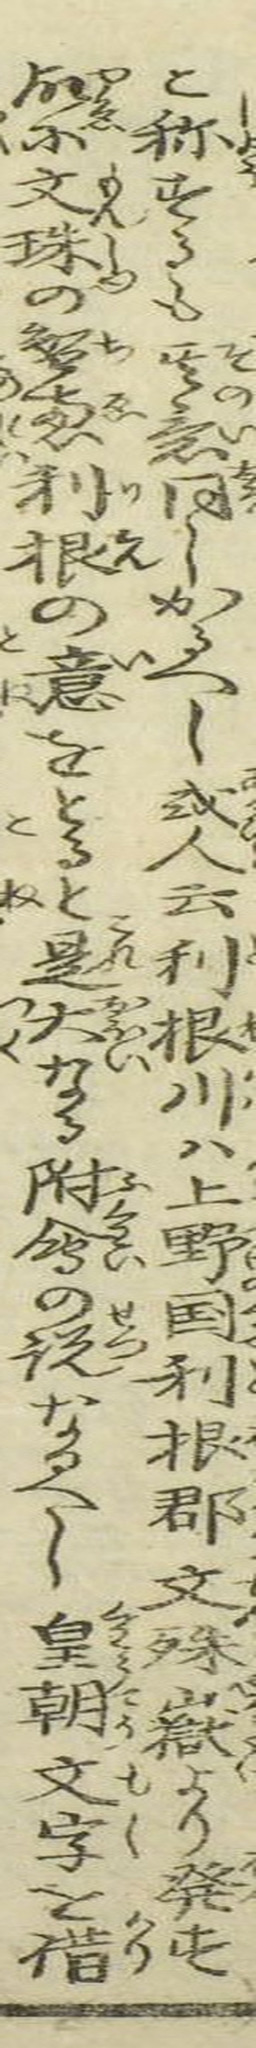故に文珠の智恵利根の意をとると是大なる附会の説なるへし皇朝文字を借
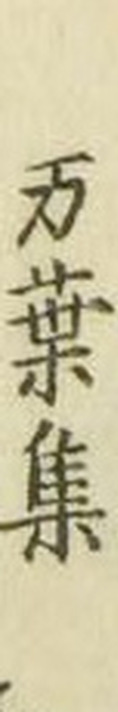万葉集
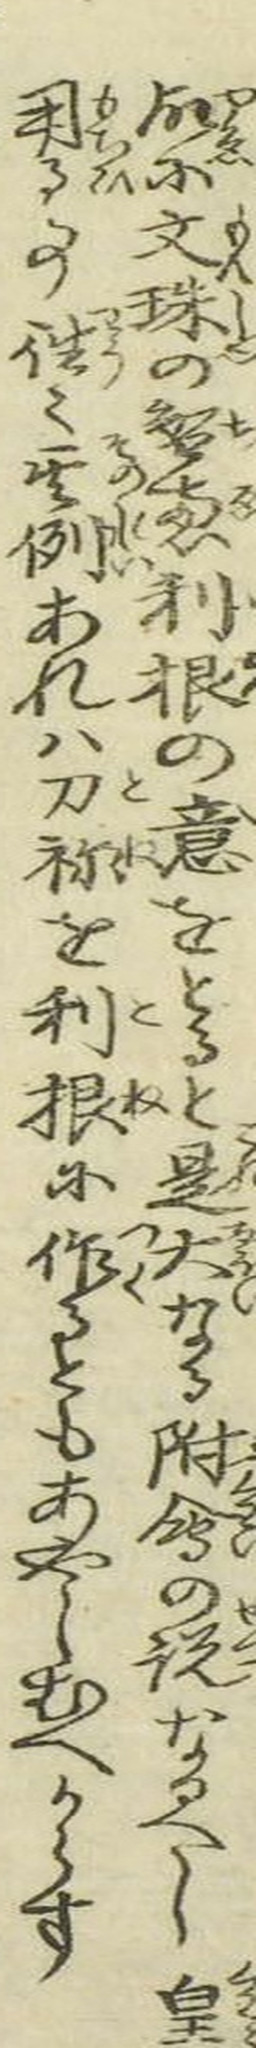用る事往々其例あれは刀祢を利根に作るともあやしむへからす
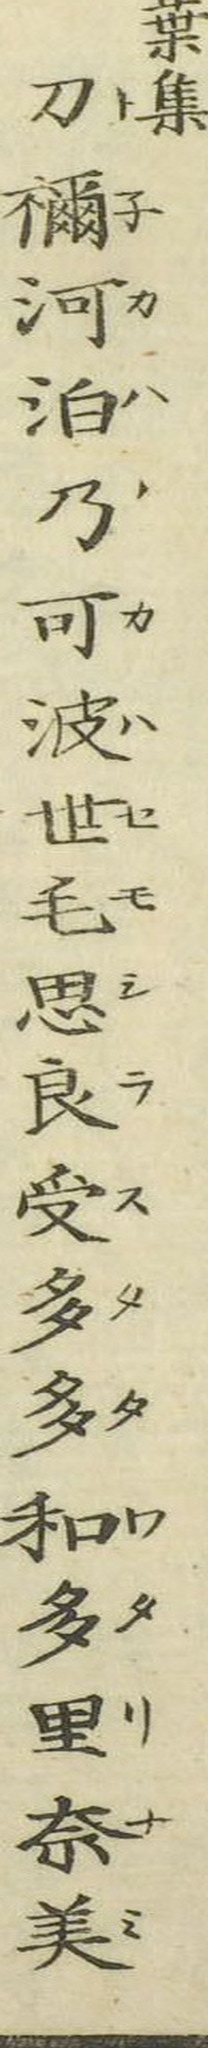刀禰河泊乃可波世毛思良受多多和多里奈美
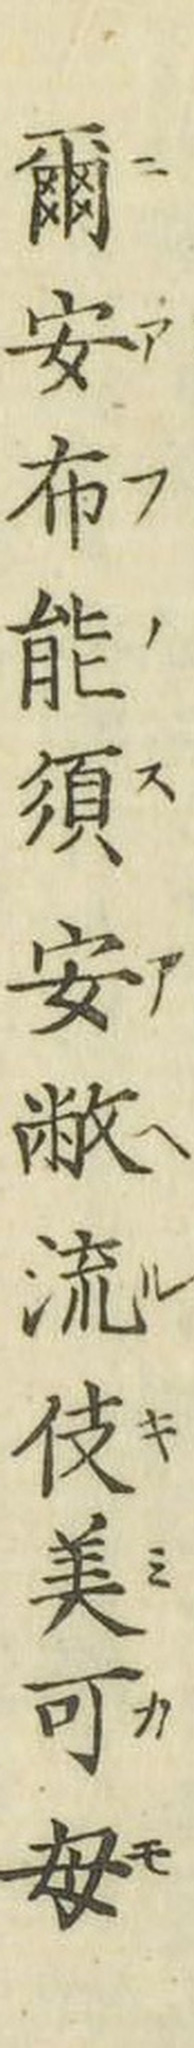爾安布能須安埤敝伎美可母
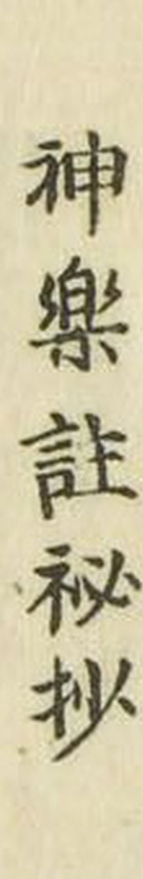神楽註秘抄
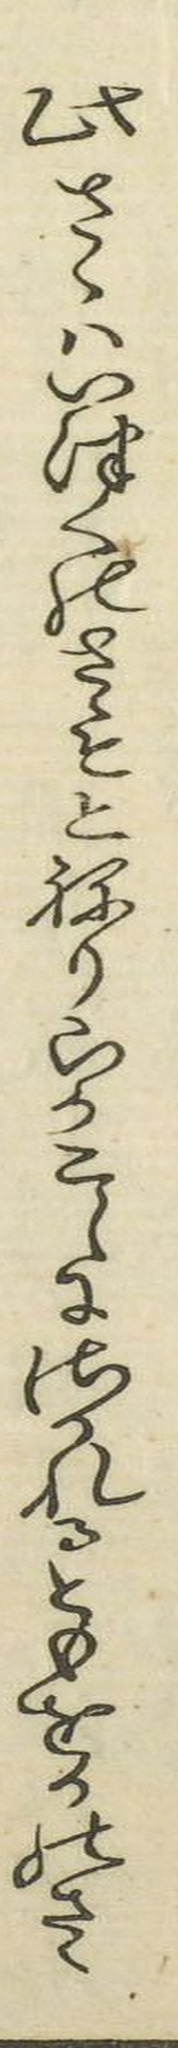此さゝはいつくのさゝととねりらかこしにさかれるともをかのさゝ
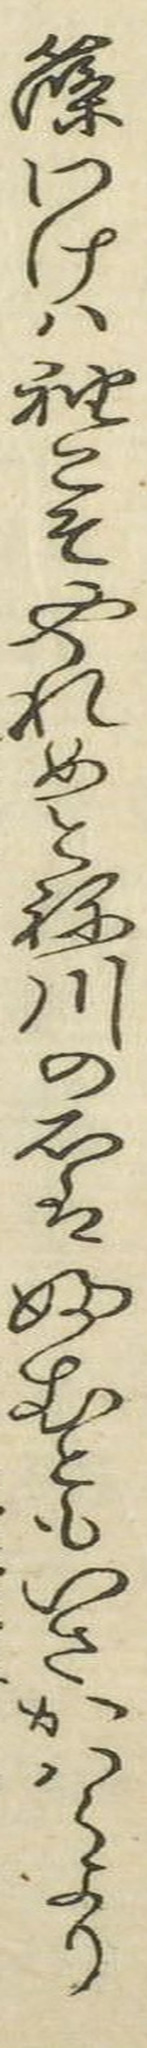篠わけは袖こそやれめとね川の石はふむともいさかはらより
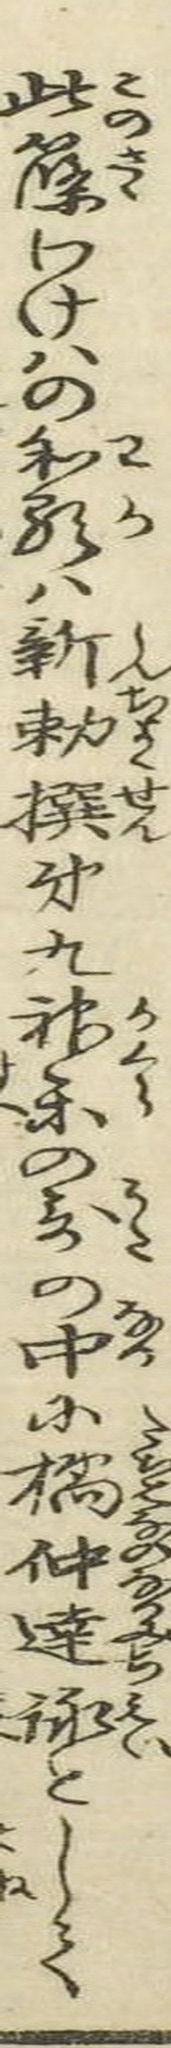此篠わけはの和歌は新勅撰第九神楽の歌の中に橘仲達詠として
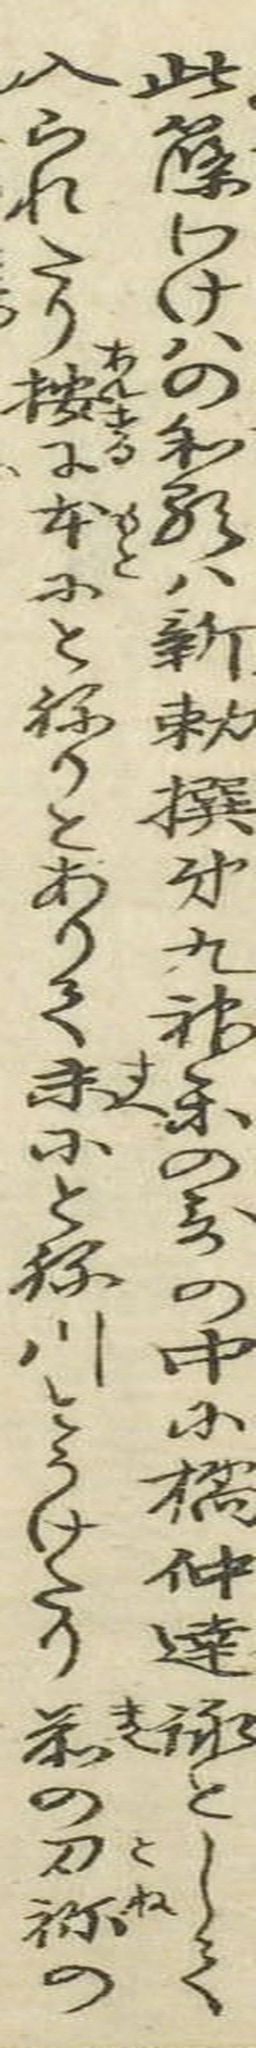入られたり按に本にとねりとありて末にとね川とうけたり前の刀祢の
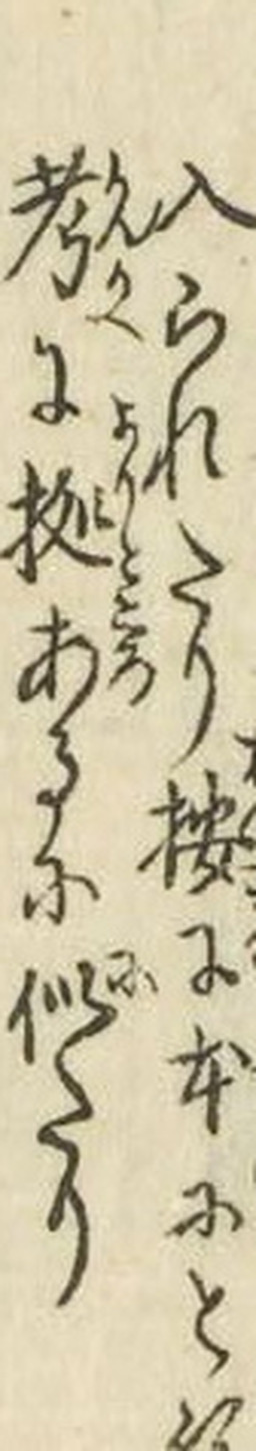考に拠あるに似たり
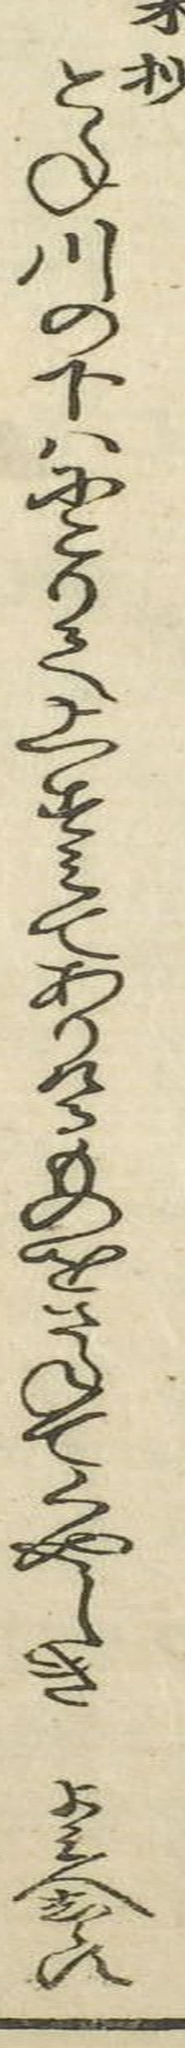とね川の下はにこりて上すみてありけるものをさねてくやしきよみ人しらす
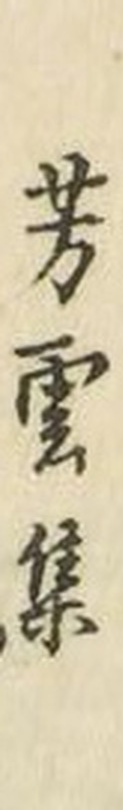芳雲集
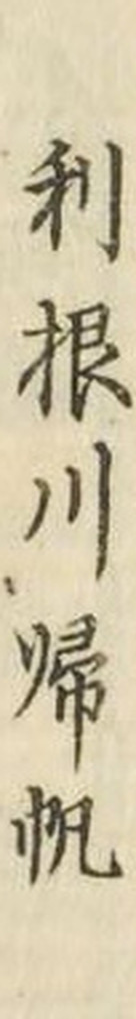利根川帰帆
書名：江戸名所図会 20巻 巻之20
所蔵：東京学芸大学教育コンテンツアーカイブ
